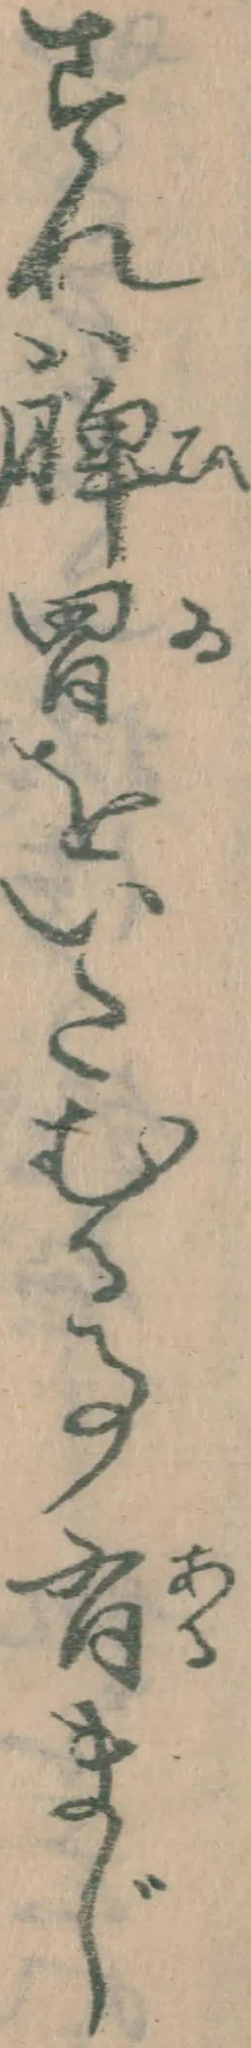すれは脾胃をいたむる事有まじ
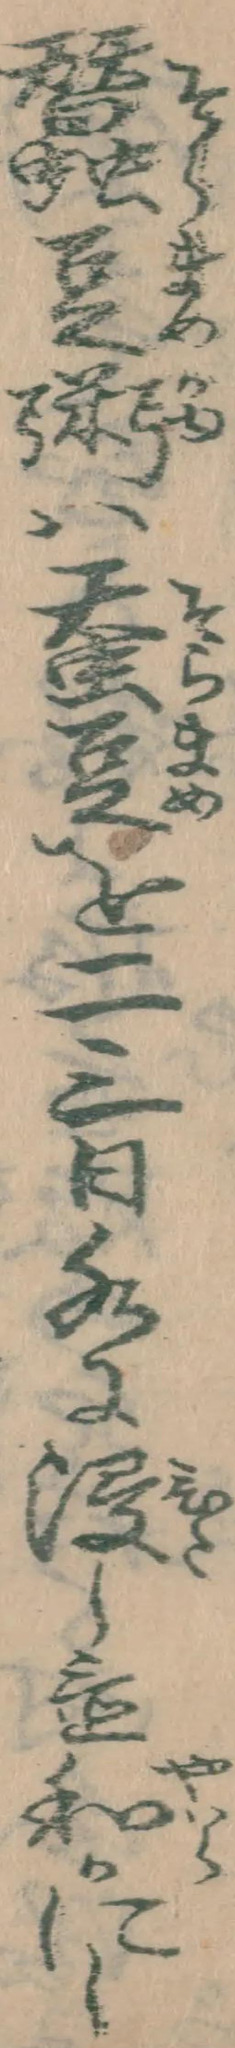蠶豆粥は蚕豆を二三日水に浸し置和かにし
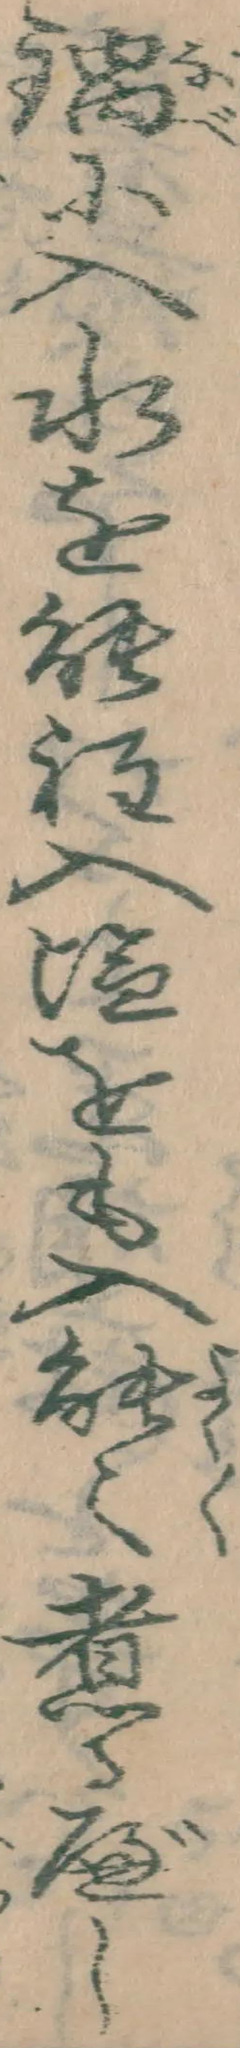鍋に入水を能程入塩をも入能々煮るべし
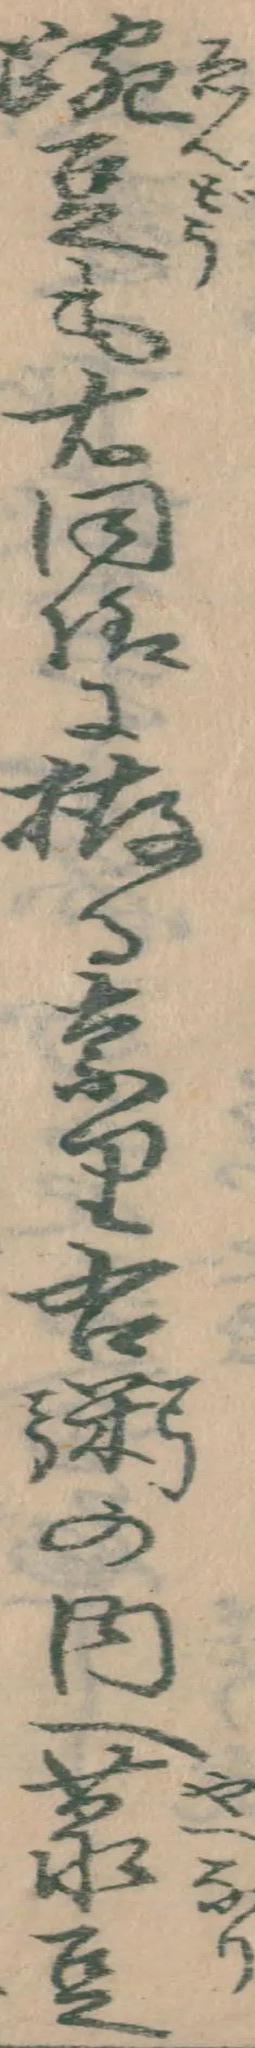踠豆も右同様に拵る奈里右粥の内へ豆
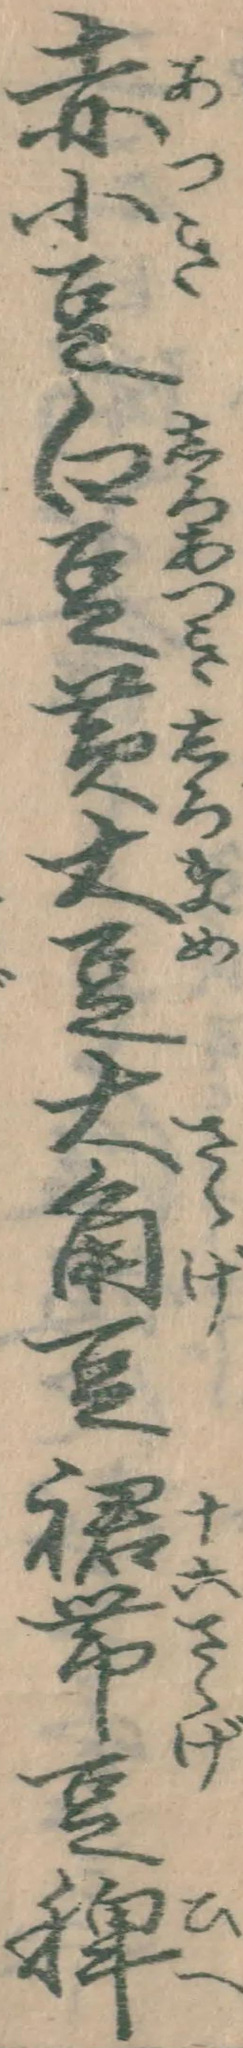赤小豆白豆黄大豆大角豆裙常豆稗
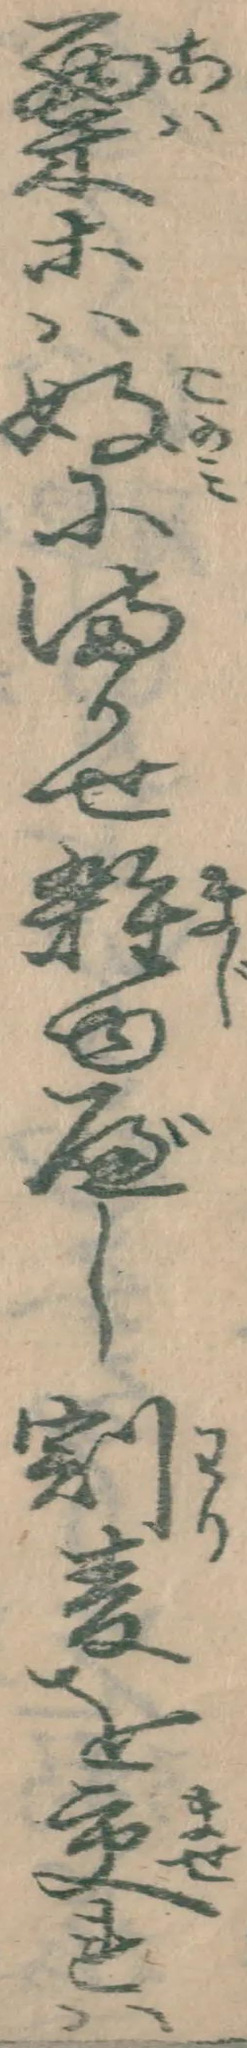粟等は好に満かせ雑ゆべし割麦を交れは
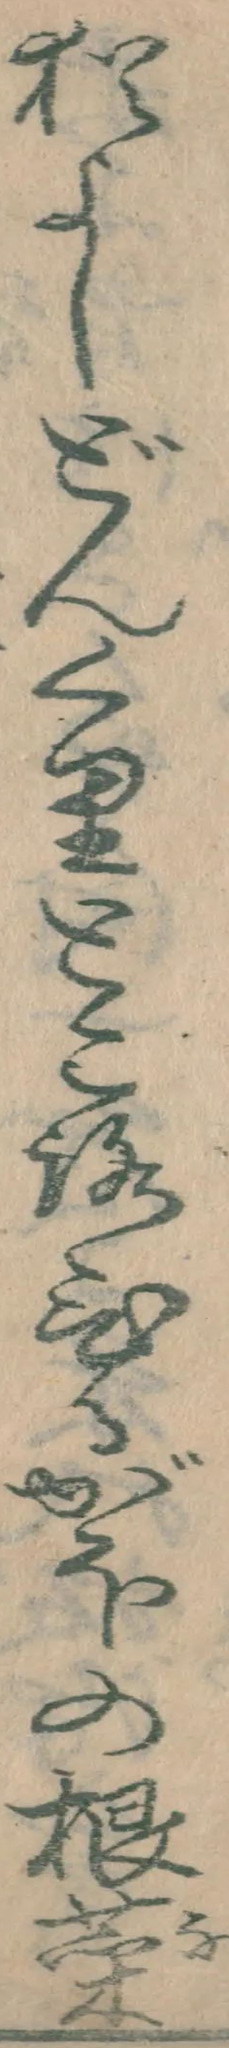程よしどんく里とこ路飛るがほの根菜
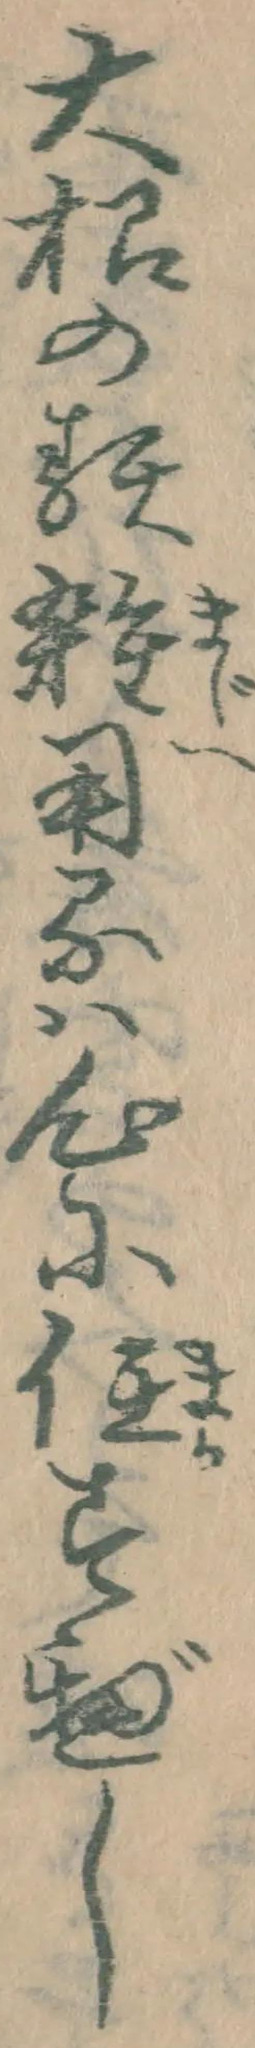大根の類雑用るは心に任すべし

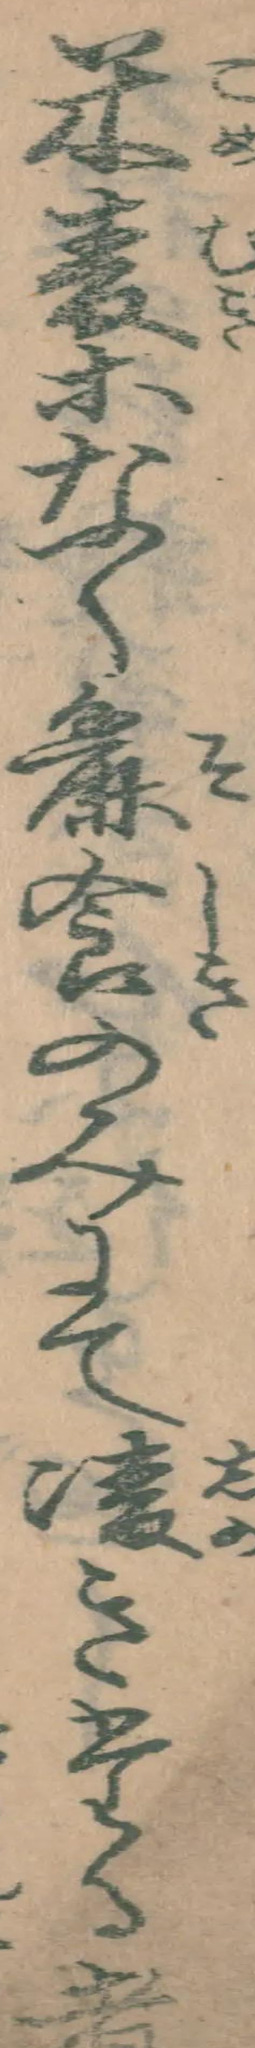米麦等なく麁食のみにて凌き堂る者
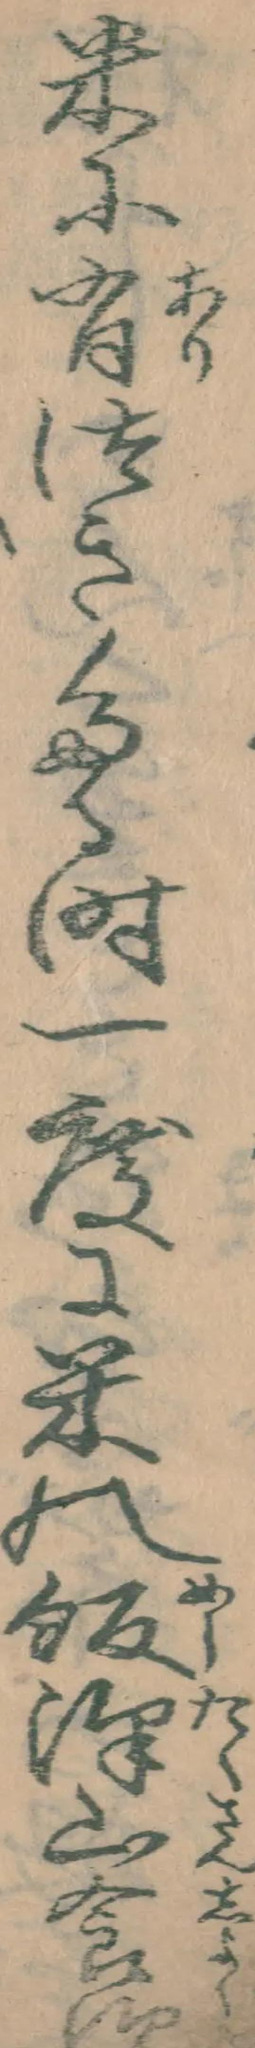米に有徒き多る時一度に米の飯沢山食須
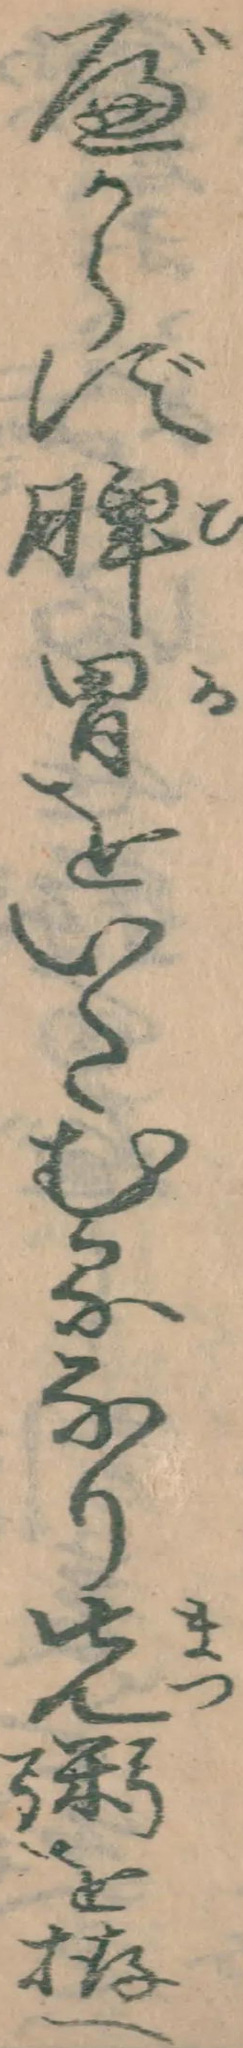べからず脾胃をいたむるなり先粥を拵へ
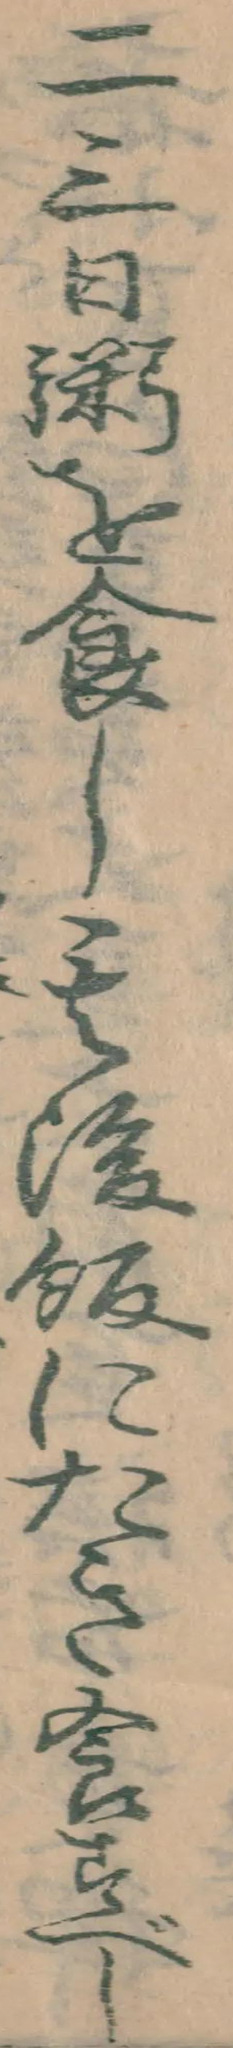二三日粥を食し其後飯にたき食春べし
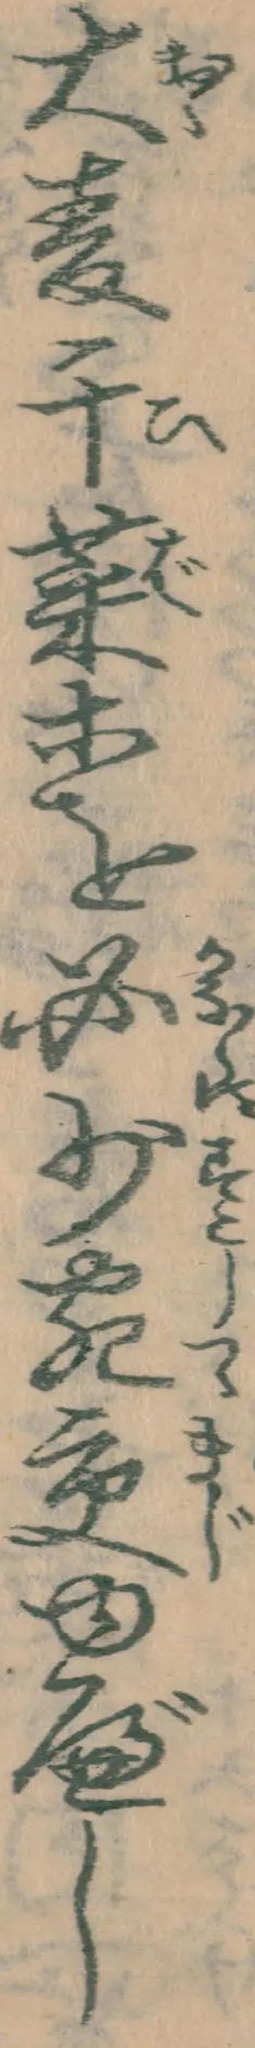大麦干葉等を必少宛交ゆべし
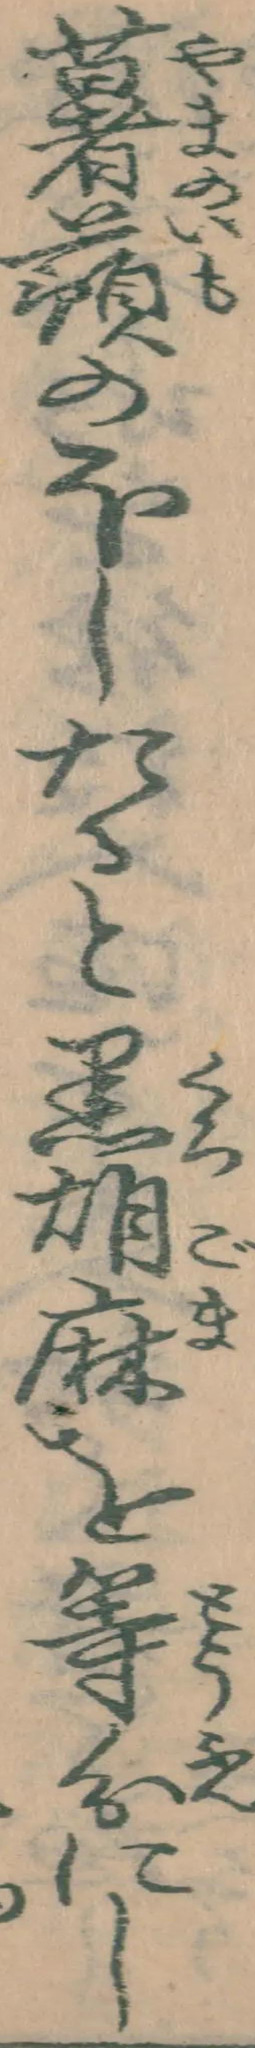薯蕷の本したると黒胡麻を等分にし
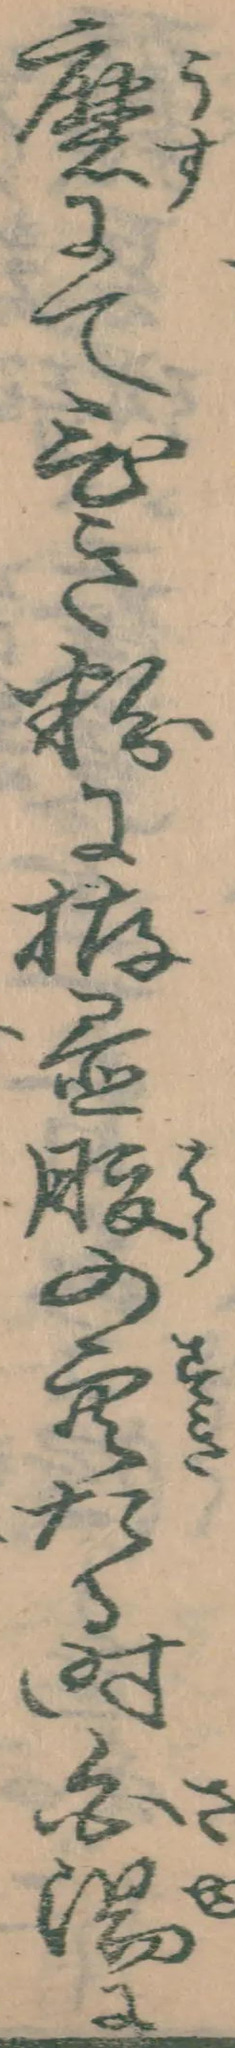磨にて飛き粉に拵置腹の空たる時白湯に
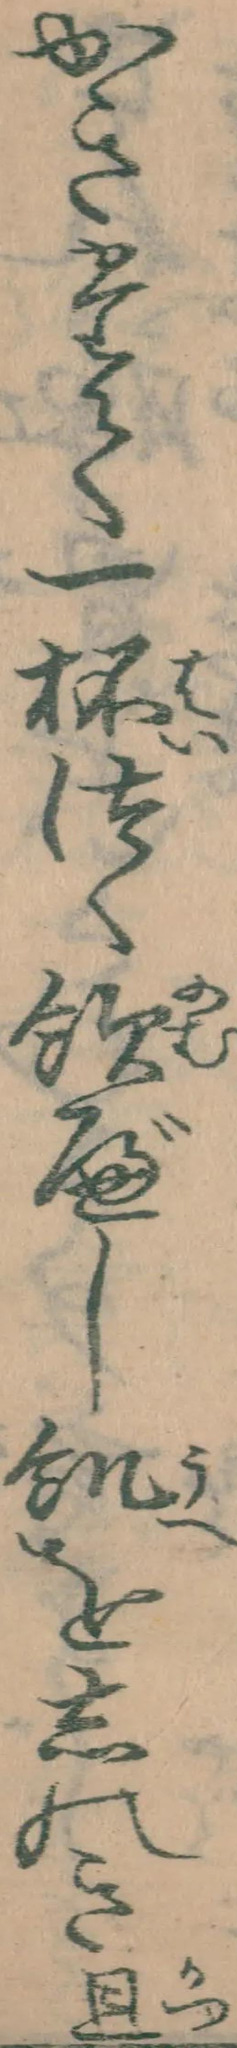かき堂て一杯徒ゝ飲べし飢を志のき且
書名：救荒鄙諭
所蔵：国立国会図書館 National Diet Library, JAPAN
